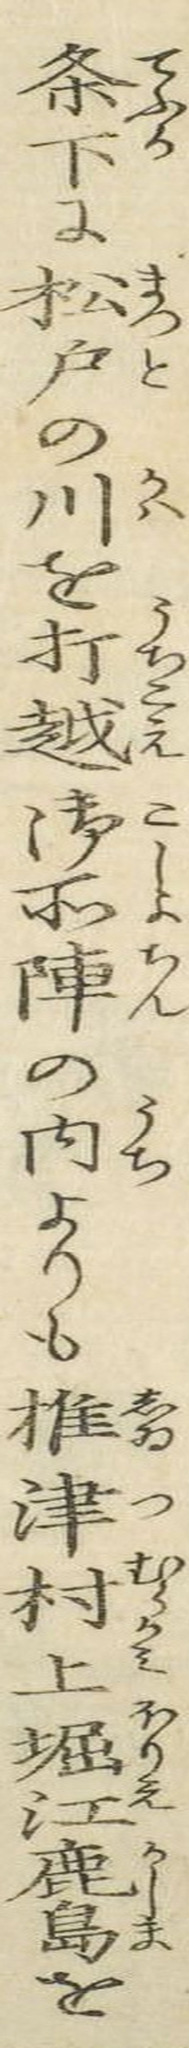条下に松戸の川を打越御所陣の内よりも椎津村上堀江鹿島を
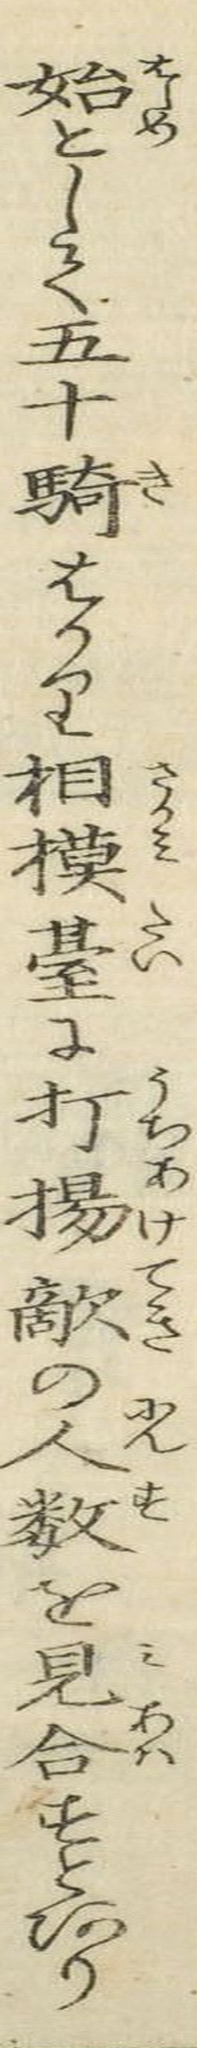始として五十騎はかり相模台に打揚敵の人数を見合すとあり
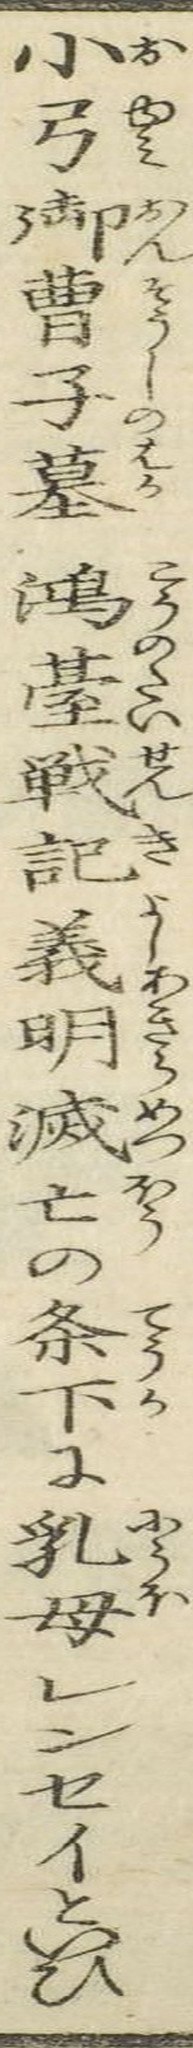小弓御曹子墓鴻台戦記義明滅亡の条下に乳母レンセイといひ
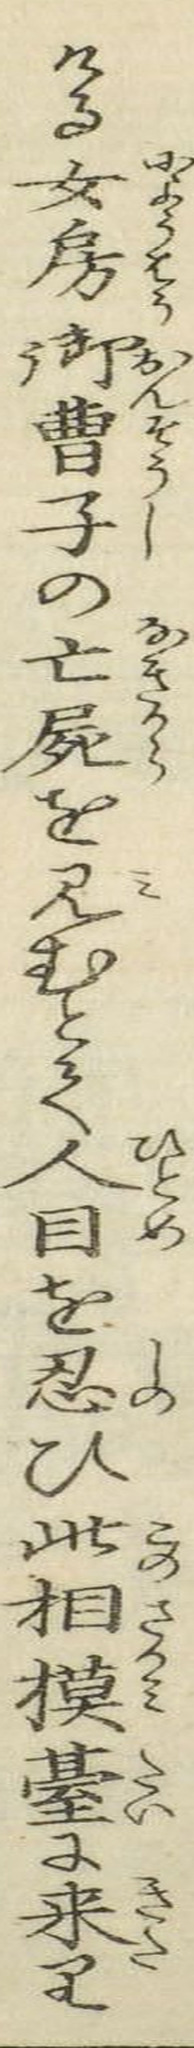ける女房御曹子の亡屍を見むとて人目を忍此相模台に来り
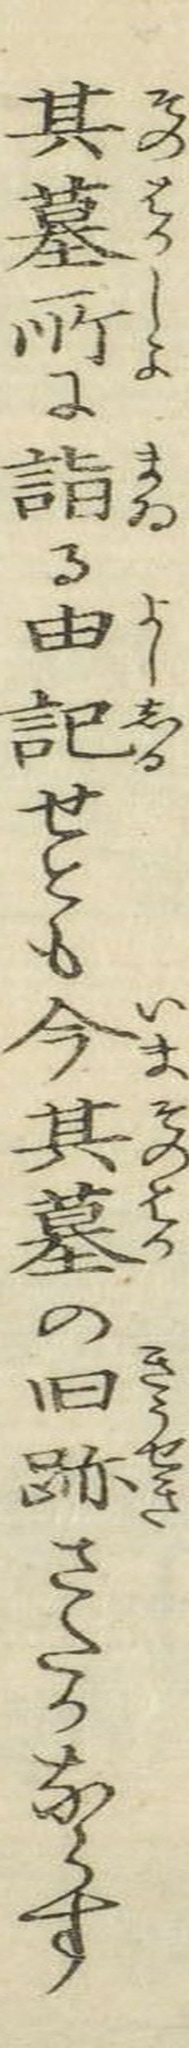其墓所に詣る由記せとも今其墓の旧跡さたかならす
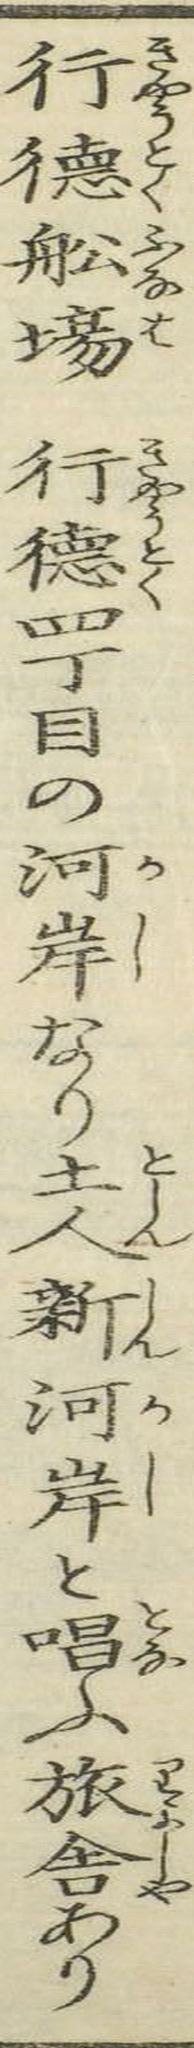行徳船場行徳四丁目の河岸なり土人新河岸と唱ふ旅舎あり
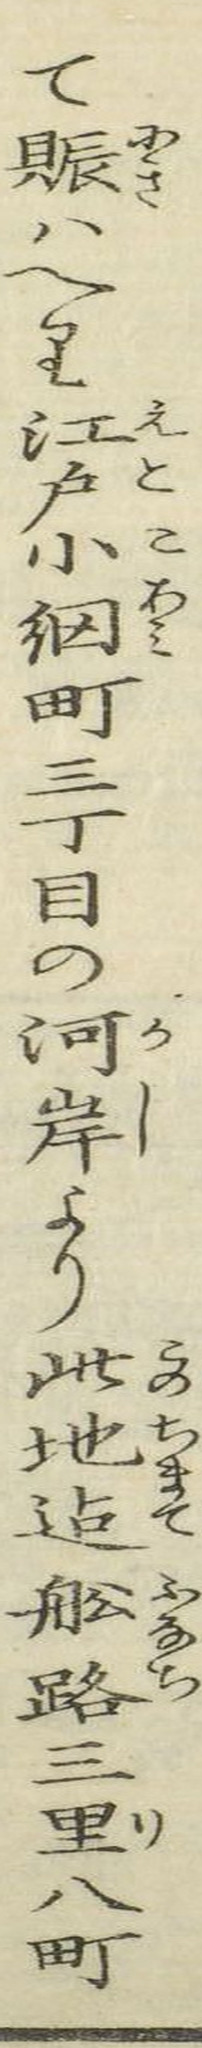て賑はへり江戸小網町三丁目の河岸より此地迄船路三里八町
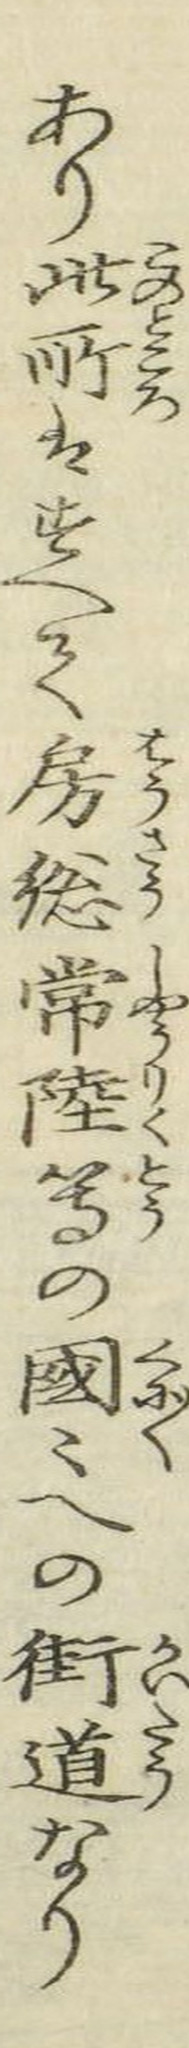あり此所はすへて房総常陸等の国々への街道なり
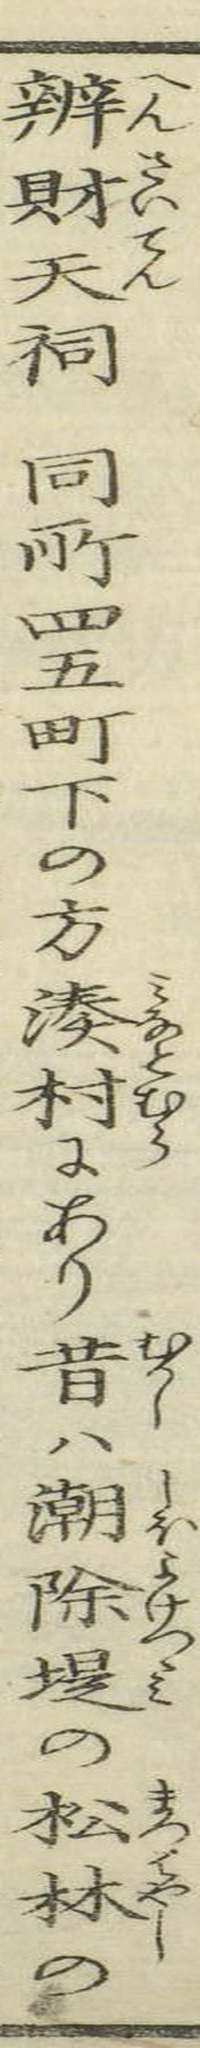弁財天祠同所四五町下の方湊村にあり昔は潮除堤の松林の
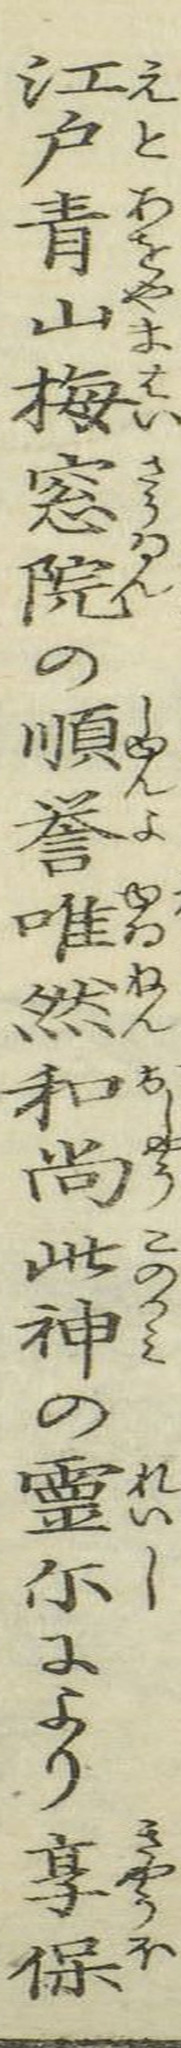江戸青山梅窓院の順誉唯然和尚此神の霊爾により享保
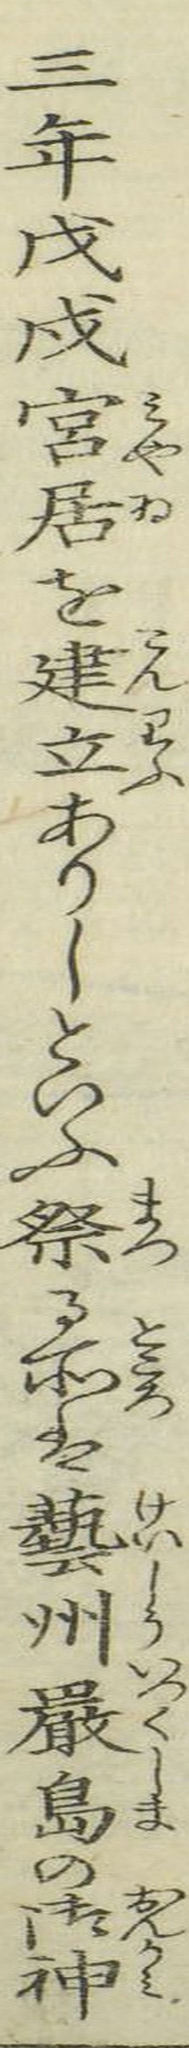三年戊戌宮居を建立ありしといふ祭る所は芸州厳島の御神
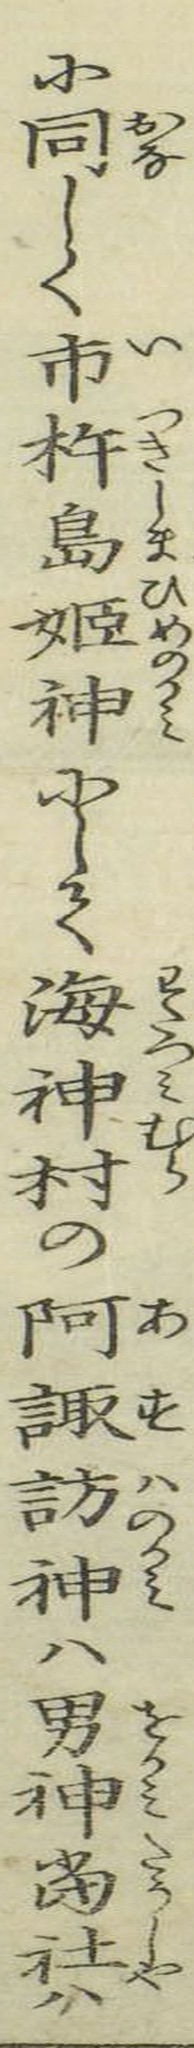に同しく市杵島姫神にして海神村の阿諏訪神は男神当社は

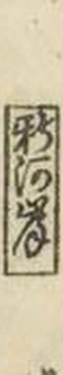新河岸
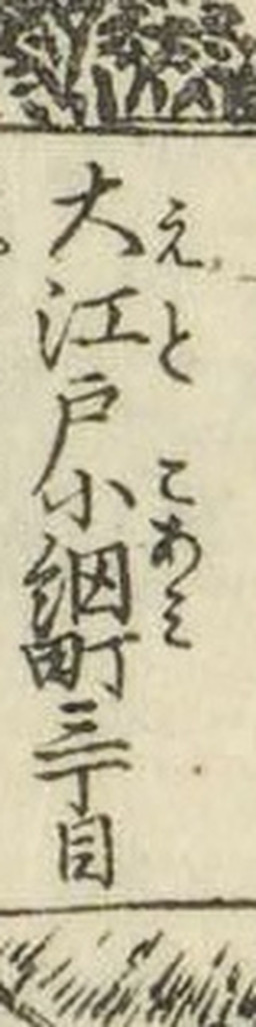江戸小網町三丁目
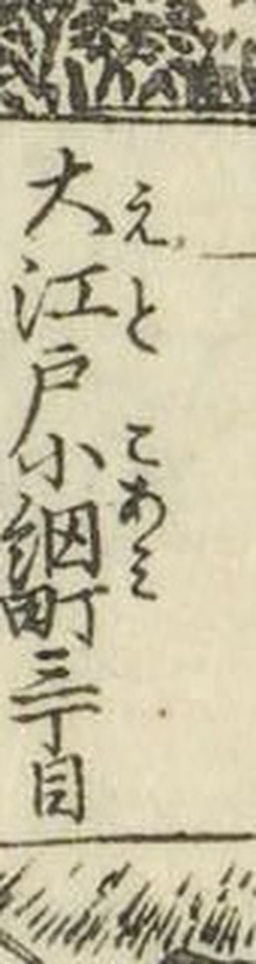江戸小網町三丁目
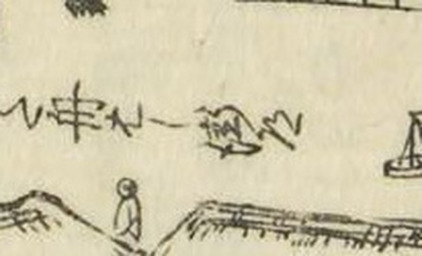八はた舟はし街道
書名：江戸名所図会 20巻 巻之20
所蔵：東京学芸大学教育コンテンツアーカイブ
